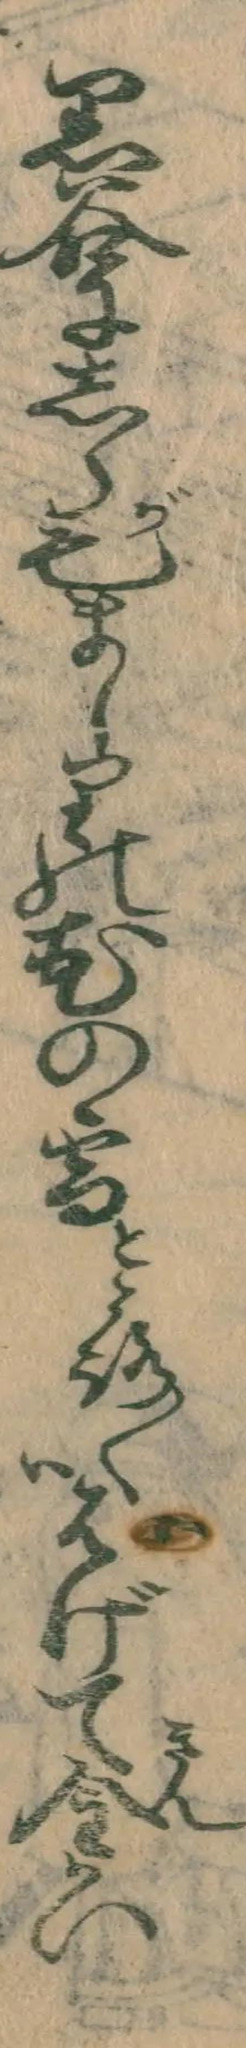黒谷にしら毛ましりの花の雪ところ〳〵ははげて金かい
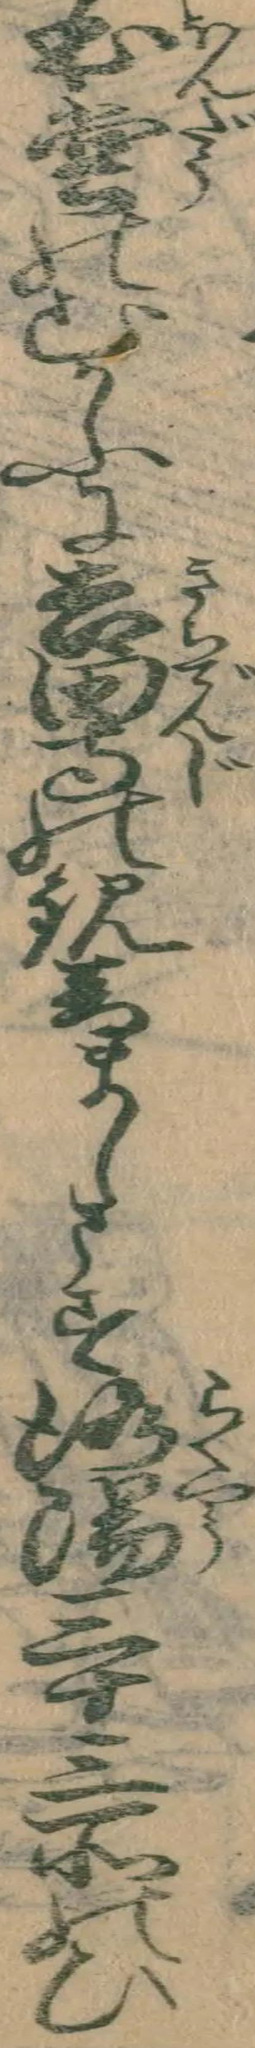本堂のむかふに吉田寺の観音まします洛陽三十三所のひ
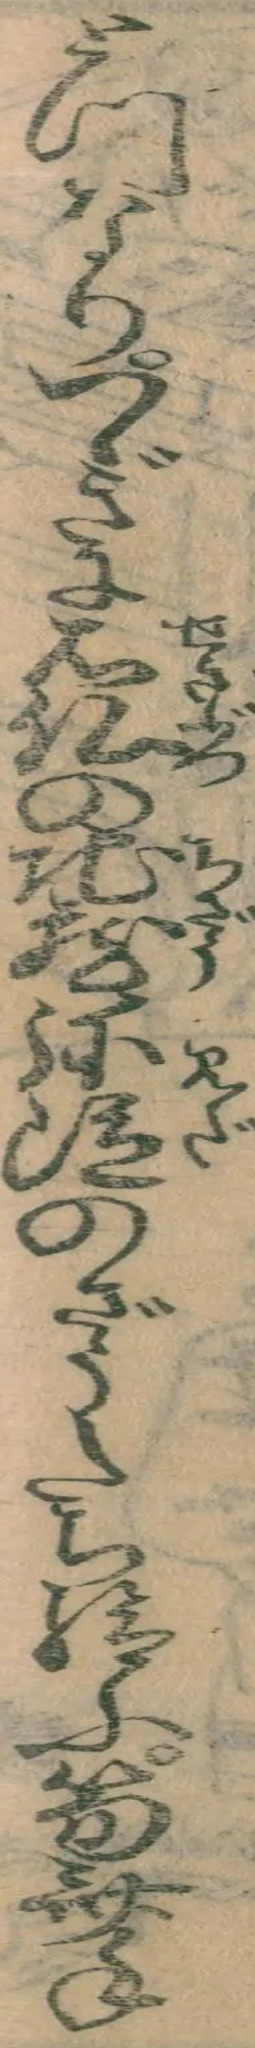とつなり。つゞきに石仏の地蔵弥陀のざうたち給ふ。筍斎手
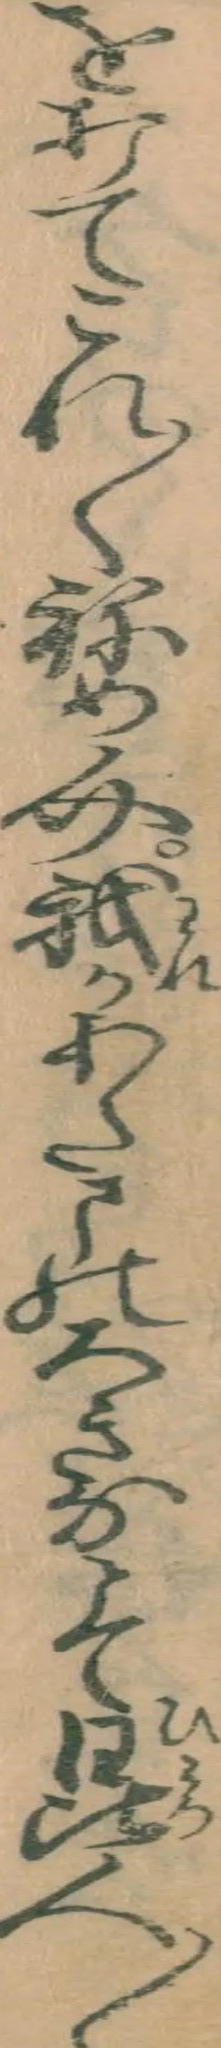を打てこれ〳〵ねめ介。我かあたまのろきなとて日頃人々
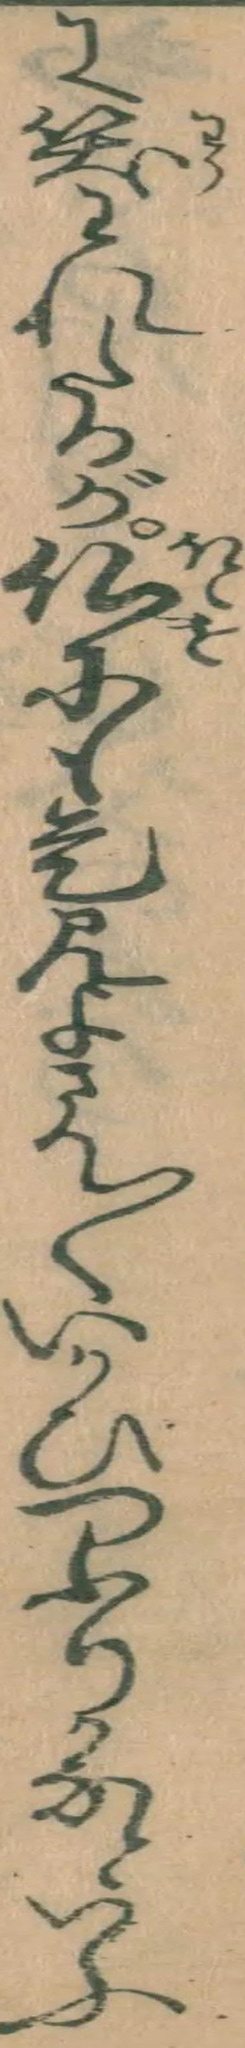に笑われたるが。仏にも是見よさん〳〵いかひつふりかなといふ
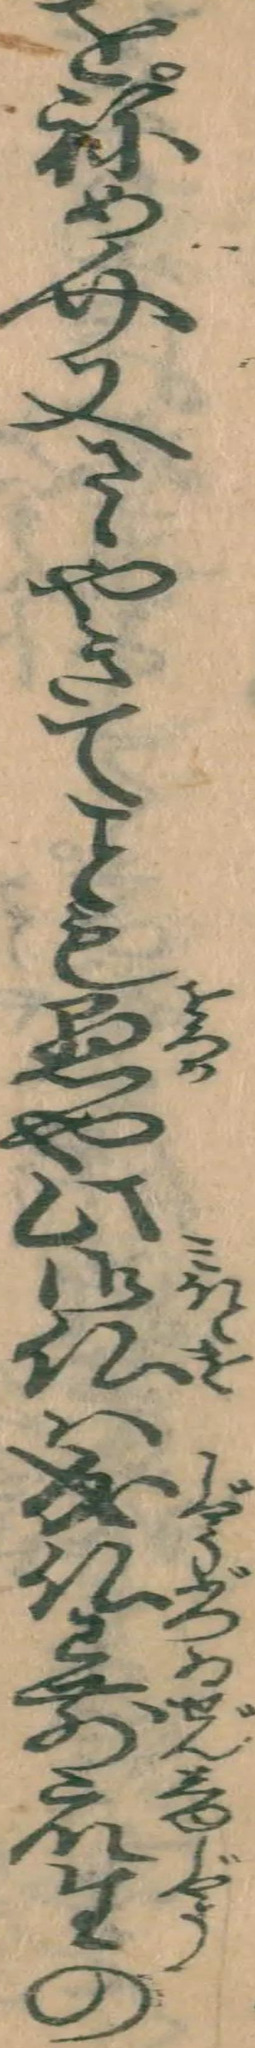を。ねめ介又さゝやきてことも愚や此御仏は成仏以前衆生の
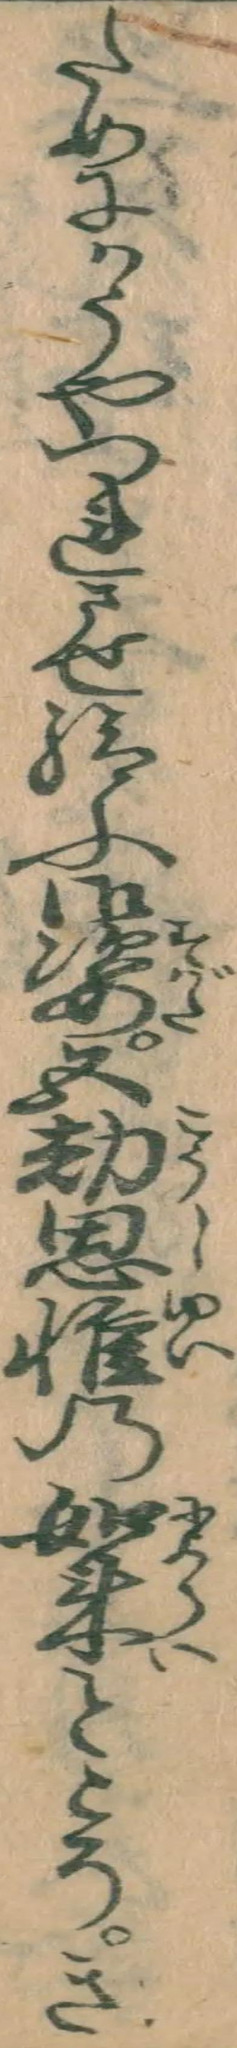ためにかうやつれさせ給ふ御姿。五劫思惟の如来とこそ。き
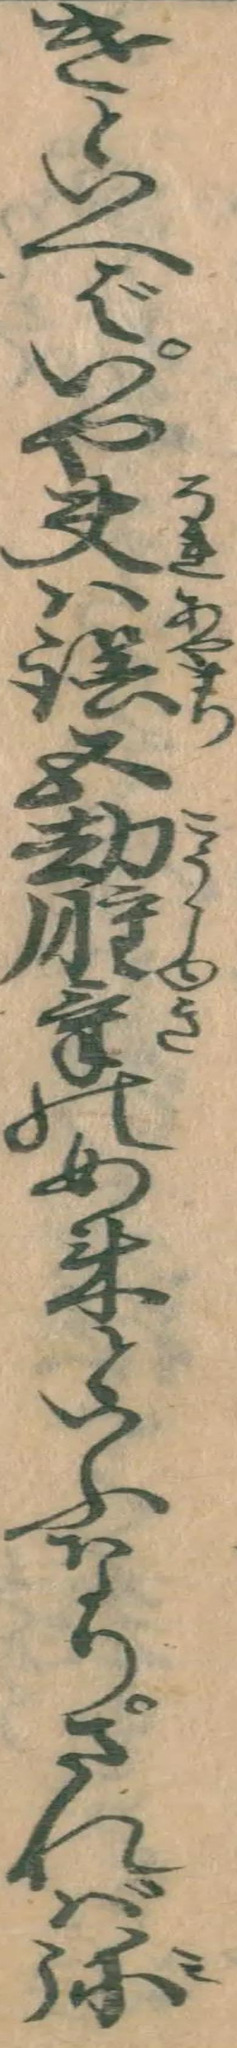けといへば。いや夫は誤五劫腫気の如来といふなり。されば弥
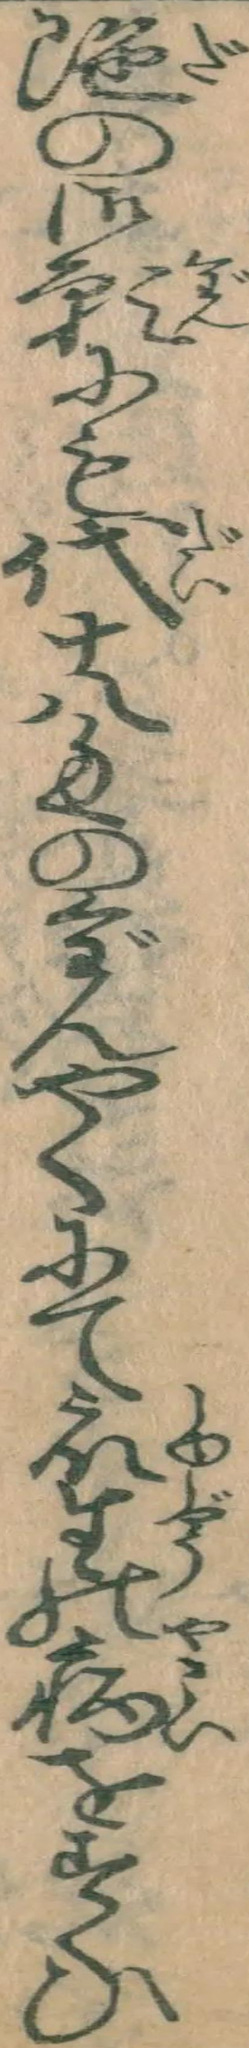陀の御願にも代十八匁のぐわんやくにて衆生の病をすくひ
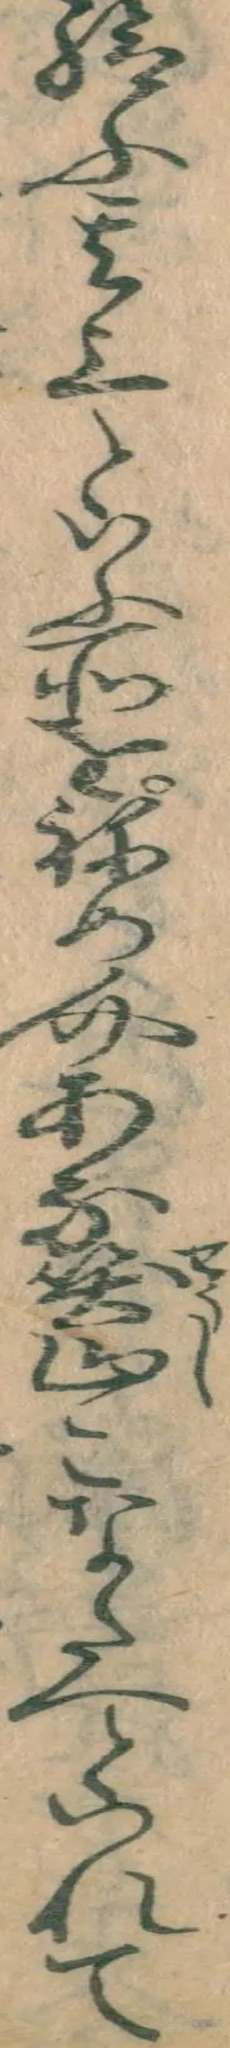給ふ其上といふ所を。ねめ介あな笑止こなたへとつれて
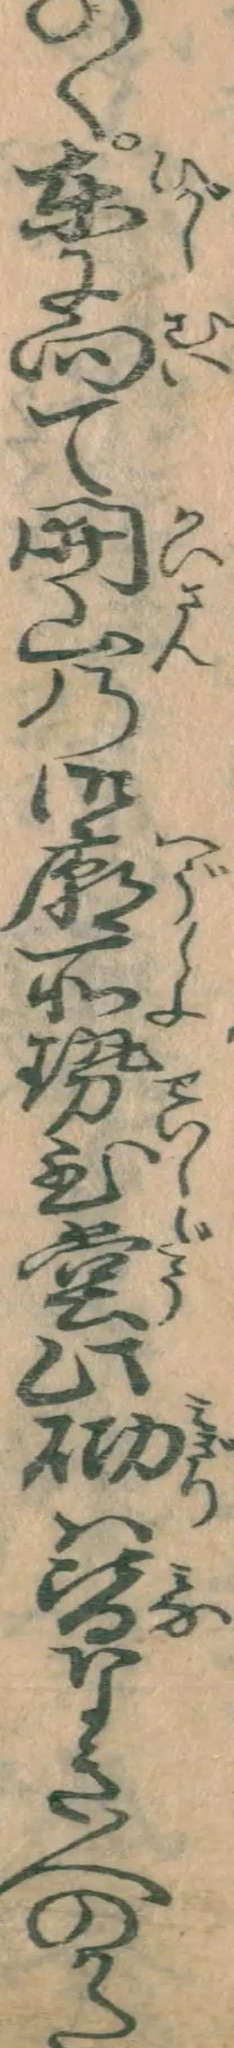のく。東に向て開山の御廟所勢至堂此砌は皆なき人のかた
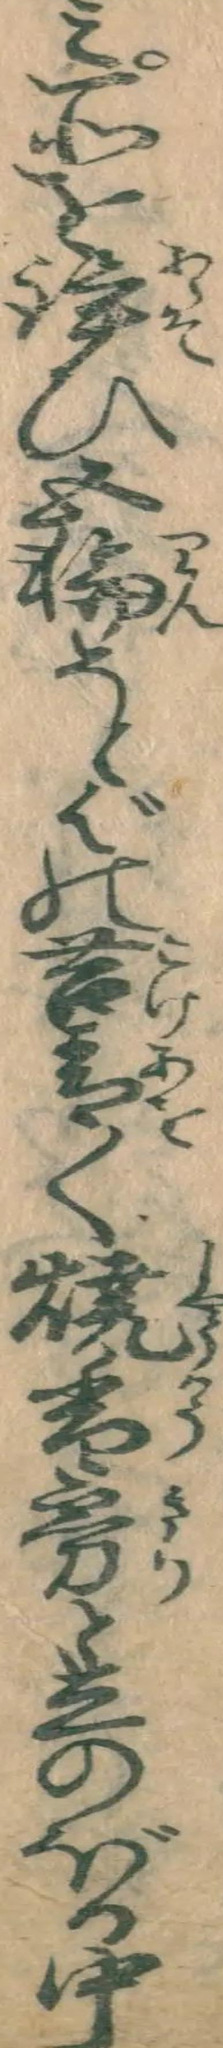み。所を諍ひ五輪そとばの苔青〱焼香霧と立のぼる中
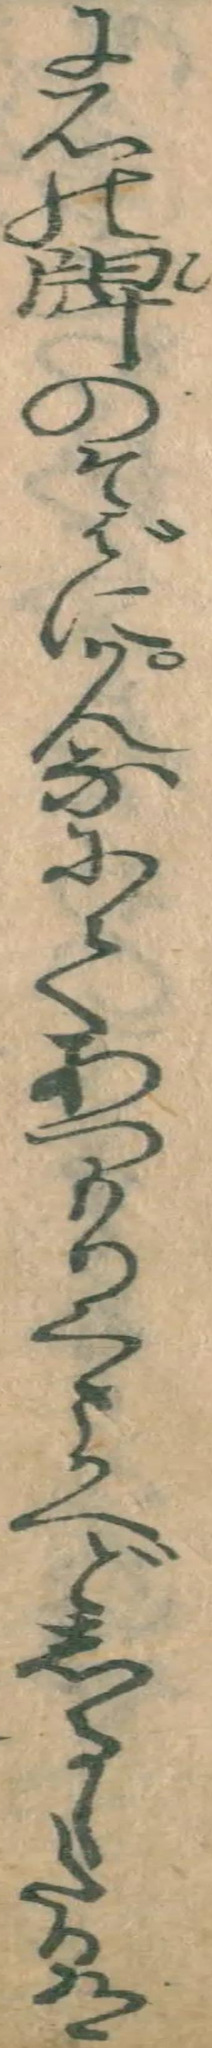に石の牌のそばに。かんなにてあつもりくまかへどしるしたる有
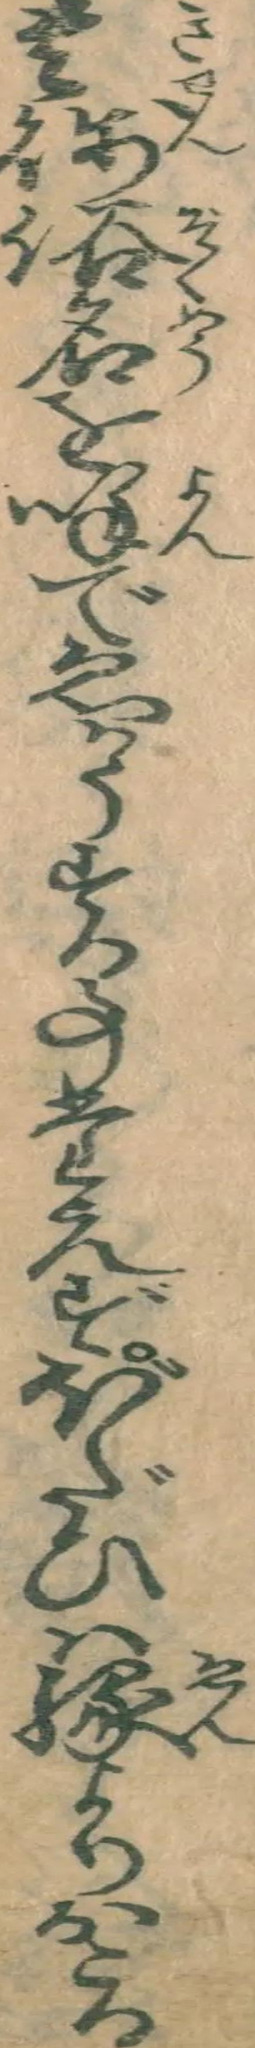貴賤俗名を呼でゑかうする事たえず。ぼだひは縁よりおこる

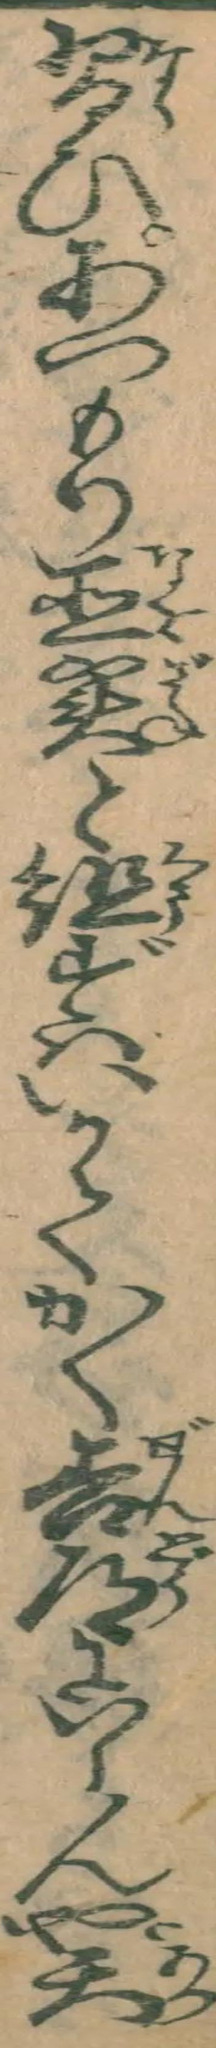習ひ。あつもり直実と組ずはいかてかく善道にいらんや。天
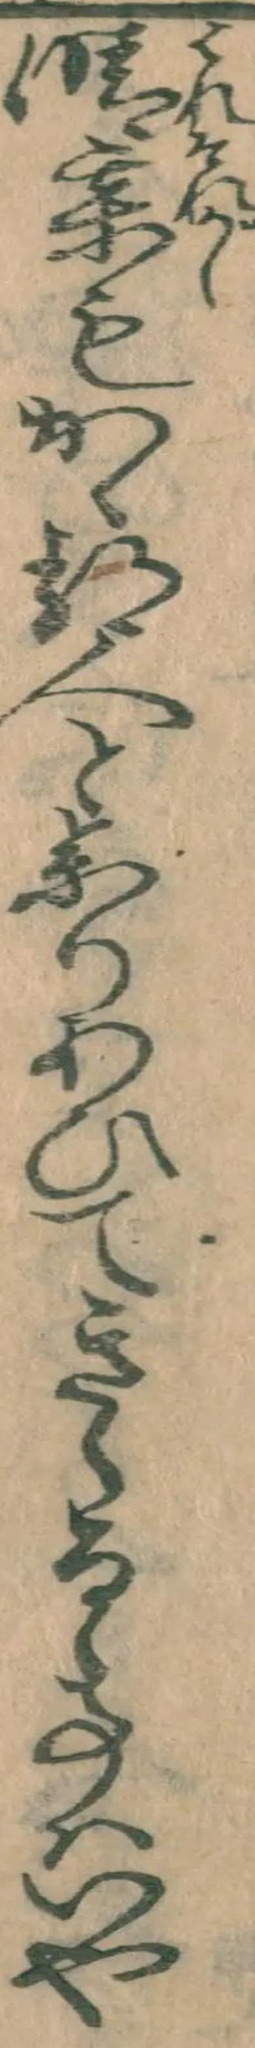晴某もかゝる人と参りあひてきらるゝ事はいや
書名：新竹斎 5巻
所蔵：国立国会図書館 National Diet Library, JAPAN
